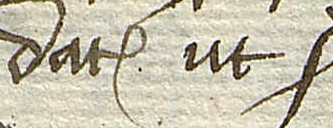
dat* ut ſ*
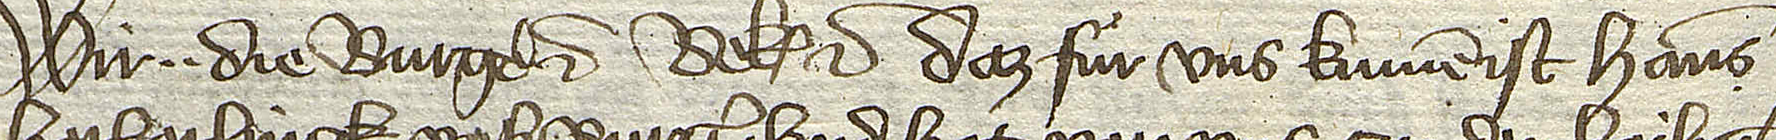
Wir ~ die Burger ec* Bek* ec* daʒ für vns kum* iſt hans*
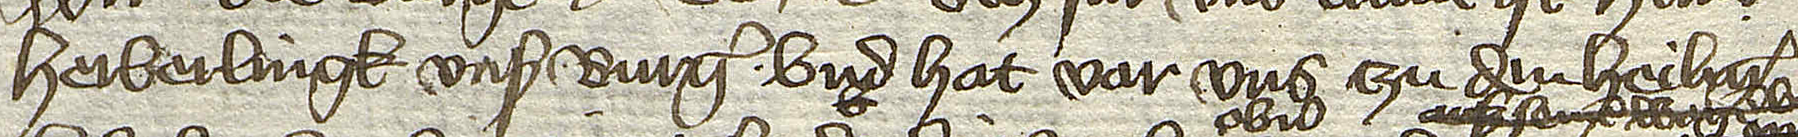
herberlingk vnſ* Burg* . vnd hat vor vns cʒu den heilig*
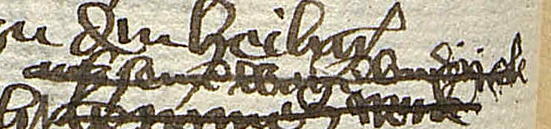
auſʒ ſeine* wage* vnd ii ele
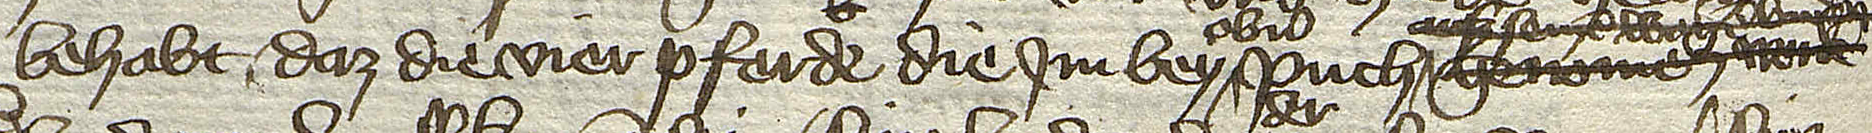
behabt / daʒ die vier pferde die Im bey puch genome* wurde*
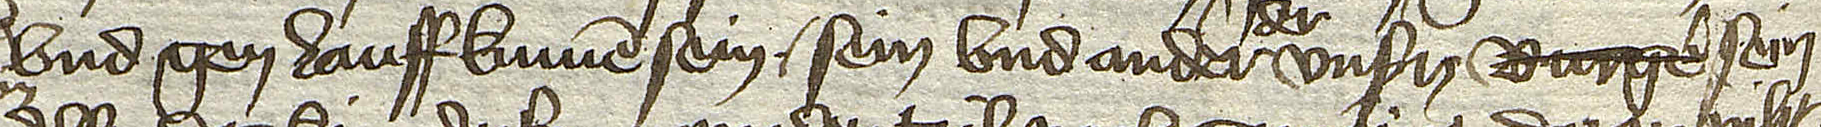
vnd gen lauff kume* ſein / ſein vnd ander vnſ*n Burge* ſein
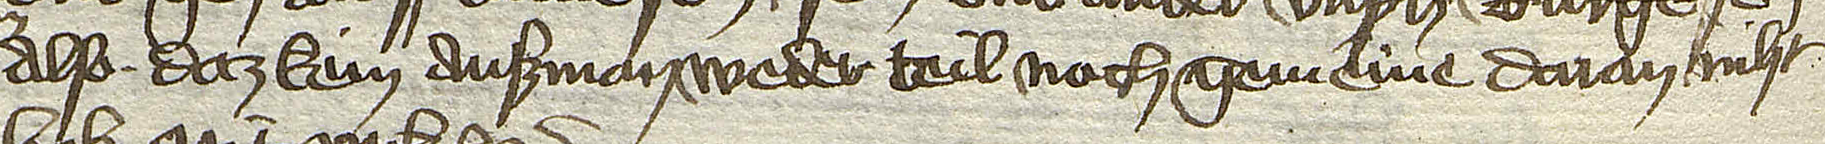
Alſo . daʒ kein Auſʒman weder teil noch gemeine daran niht
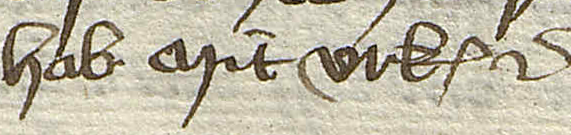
hab Mit* vrk* ec*
